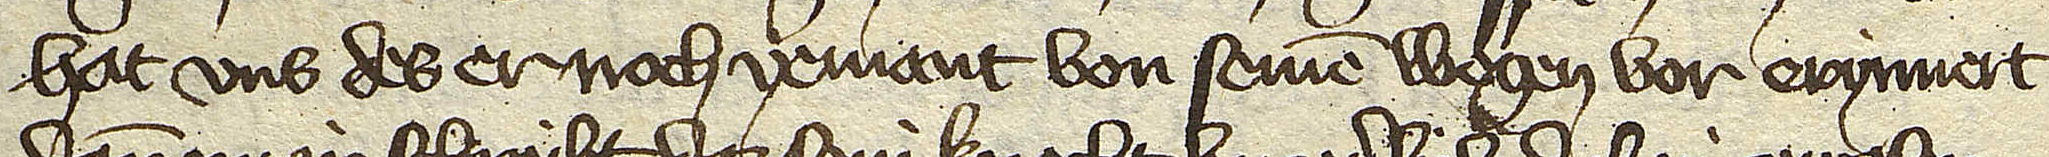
hat vns des er noch yemant von ſeine* wegen vor erynnert
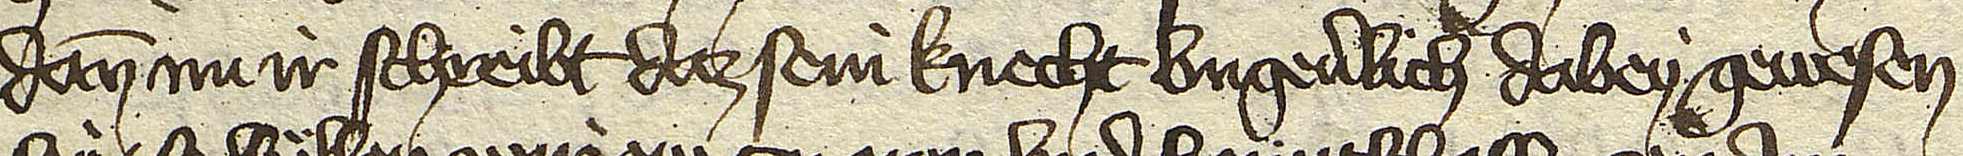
dan* nu ir ſchreibt daʒ ſein knecht vngeu*lich dabey geweſen
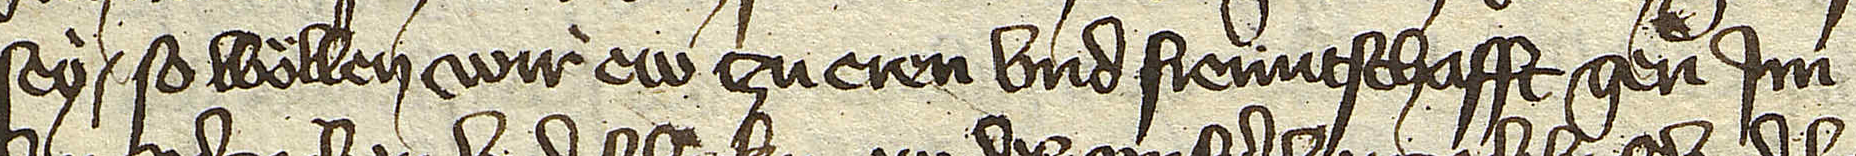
ſey / ſo wöllen wir ew cʒu eren vnd freuntſchafft gen Im
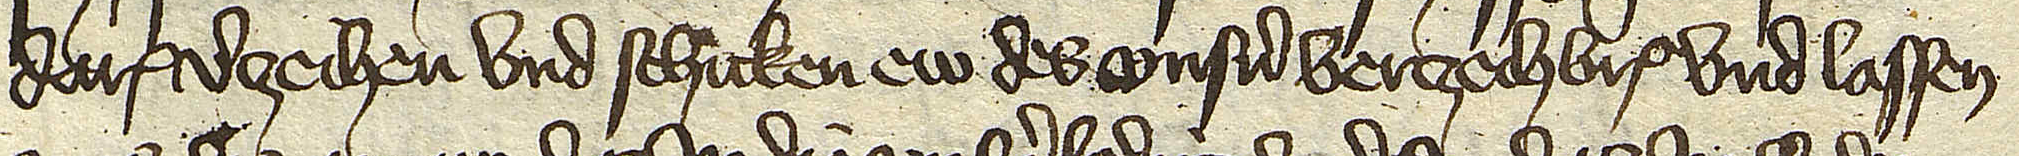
dar* v*cʒeihen vnd ſchicken ew des vnſn* vercʒeihbr* vnd laſſen
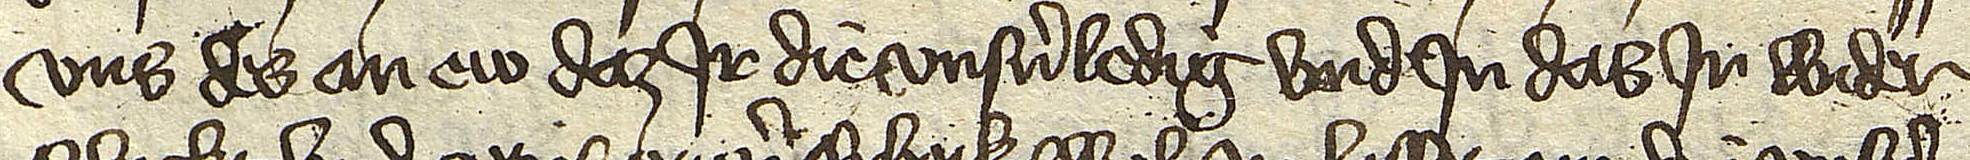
vns des an ew daʒ Ir die vnſn* ledig vnd In das Ir wider
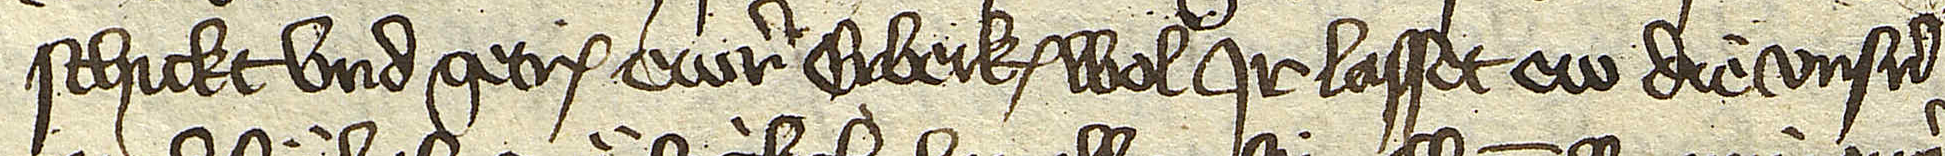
ſchickt vnd getr* ewr* Erberk* wol Ir laſſet ew die vnſn*
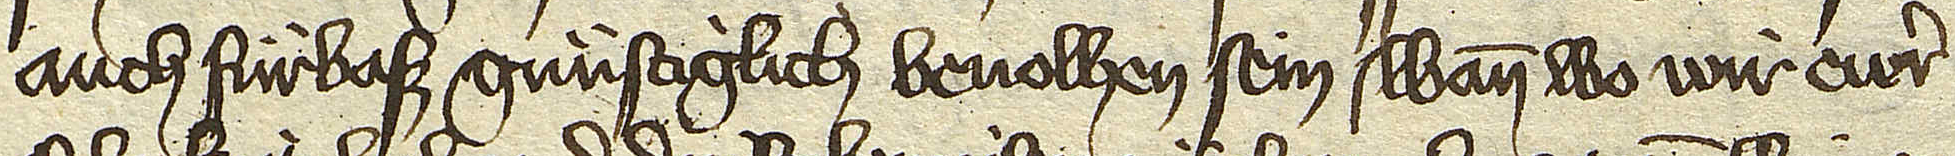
auch fürbaſʒ günſtiglich beuolhen ſein / wan* wo wir ewr*
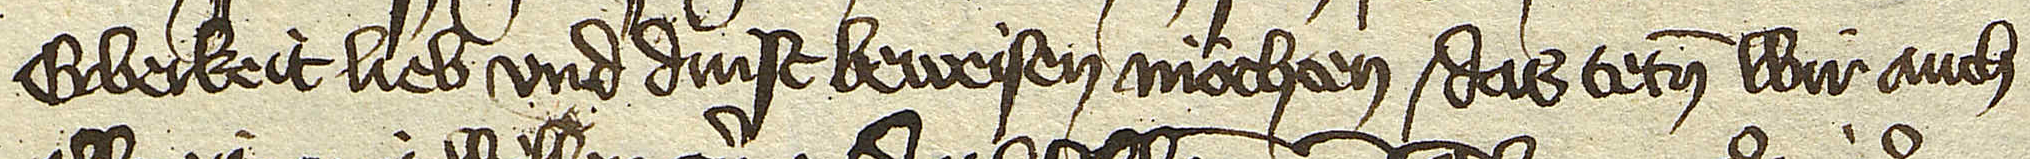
Erberkeit lieb vnd dinſt beweiſen möchten / das tetn* wir auch
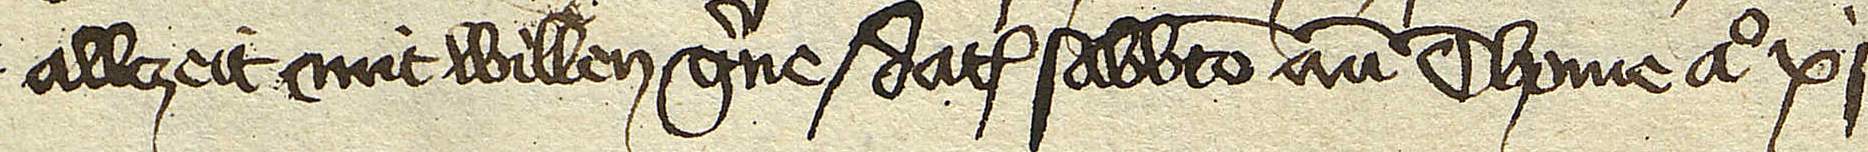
allcʒeit mit willen g*ne / dat* ſabbto* an* Thome a* xi*
